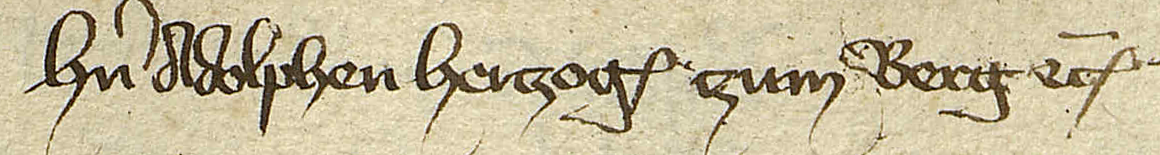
hn* Adolphen hercʒog* cʒum Berg ec*
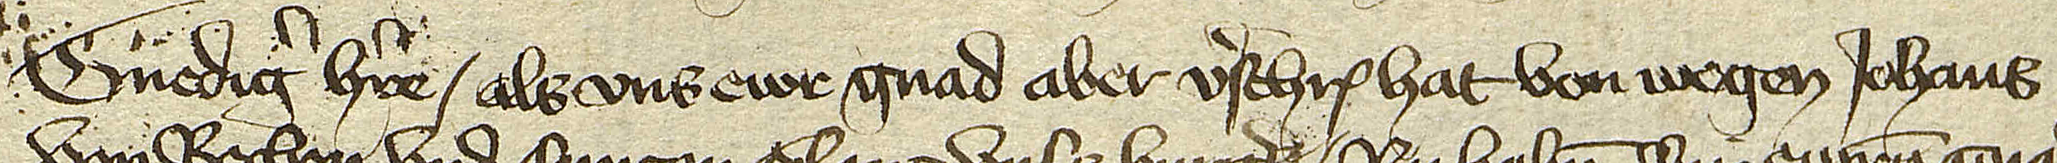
Gnedig* h*re / als vns ewr gnad aber v*ſchr* hat von wegen Iohans
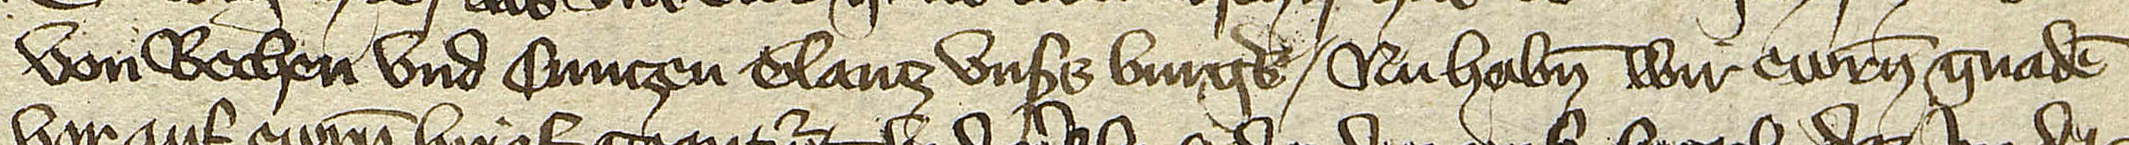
von Bechen vnd Cuncʒen Glancʒ vnſ*s burg*s / Nu habn* wir ewrn* gnade*
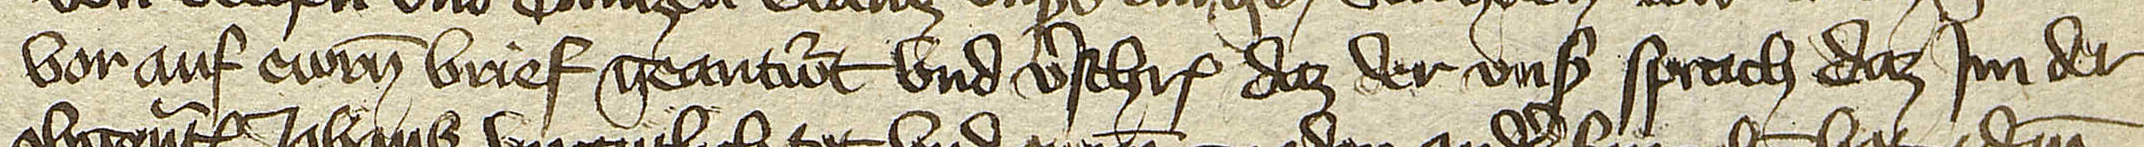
vor auf ewrn* brief geantwt* vnd v*ſchr* daʒ der vnſ* ſprach daʒ Im der
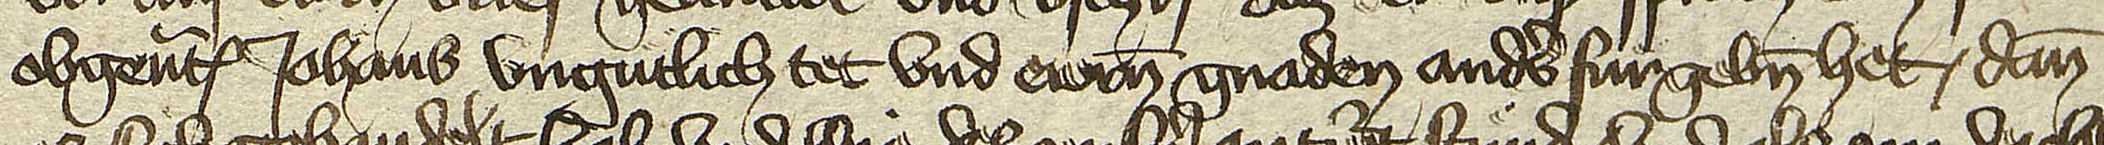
obgent* Iohans vngütlich tet vnd ewrn* gnaden ands* fürgebn* het / dan*
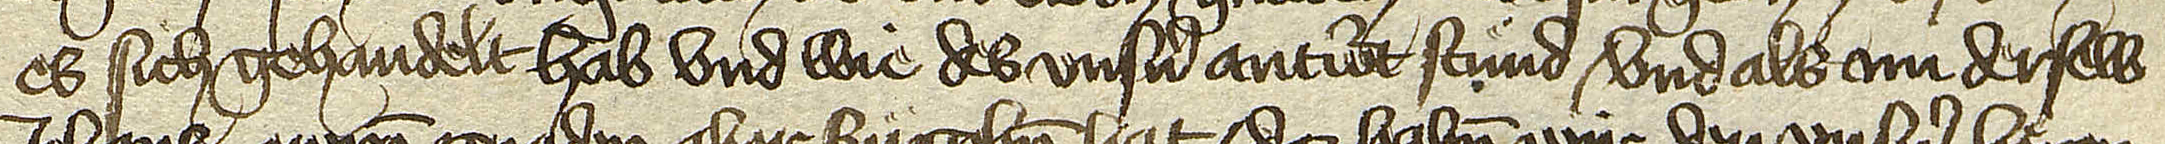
es ſich gehandelt hab vnd wie des vnſn* antwt* ſtünd / vnd als nu derſelb
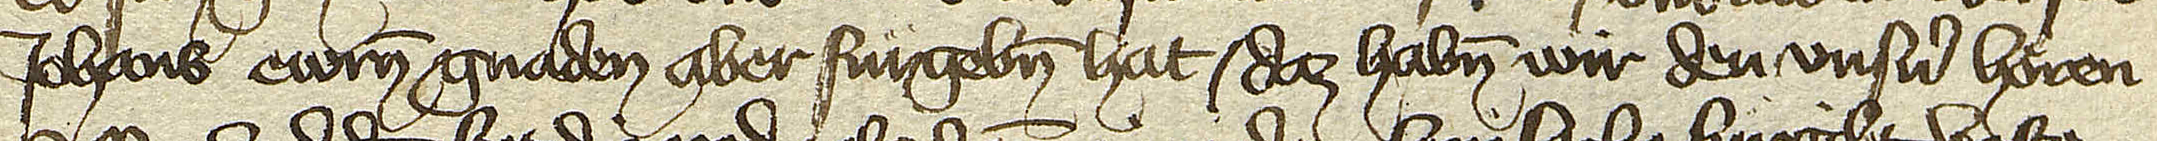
Iohans ewrn* gnaden aber fürgebn* hat / daʒ habn* wir den vnſn* hören
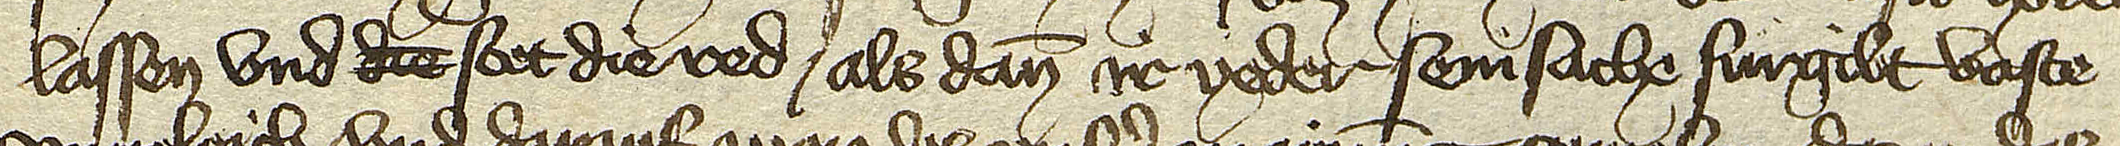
laſſen vnd die ſtet die red / als dan* ir yeder ſein ſache fürgibt vaſte
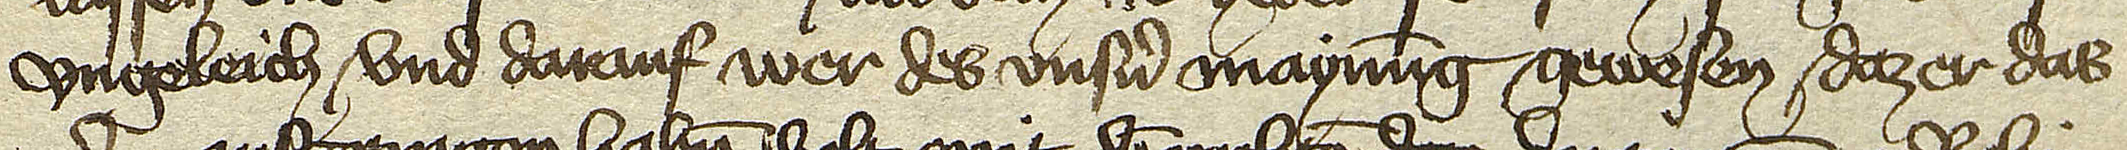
vngeleich / vnd darauf wer des vnſn* maynug* geweſen / daʒ er das
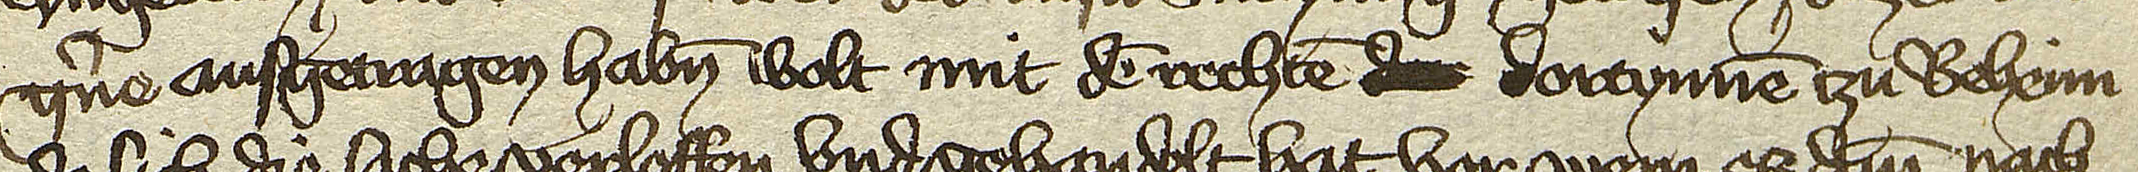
g*ne auſgetragen habn* wolt mit de* rechte* der dortynne* cʒu Beheim
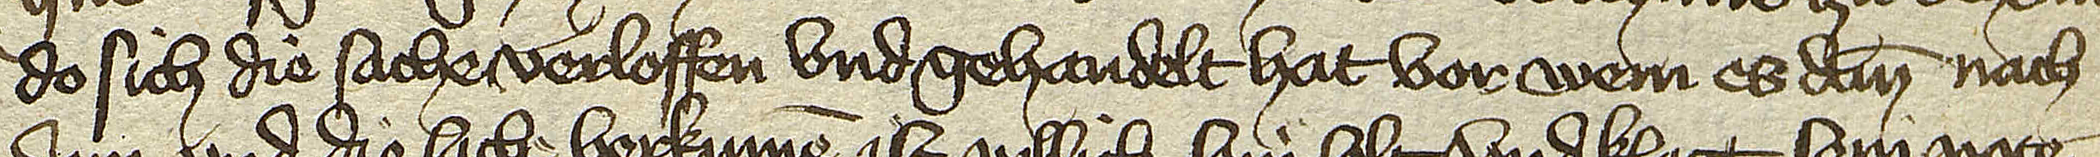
do ſich die ſache verloffen vnd gehandelt hat vor wem es dan* nach
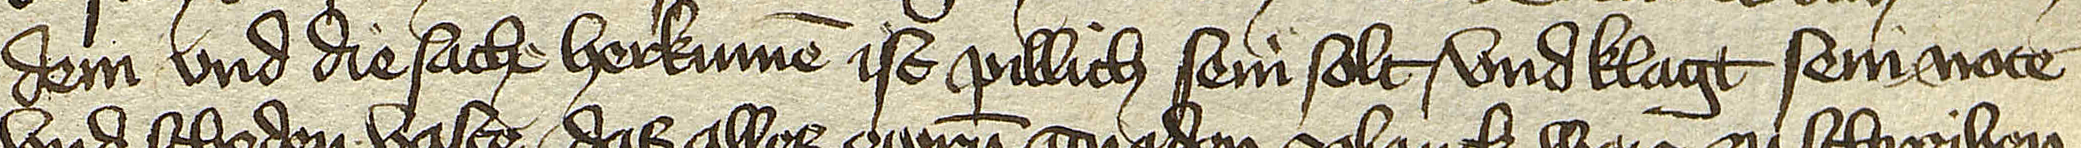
dem vnd die ſache herkume* iſt pillich ſein ſolt / vnd klagt ſein note
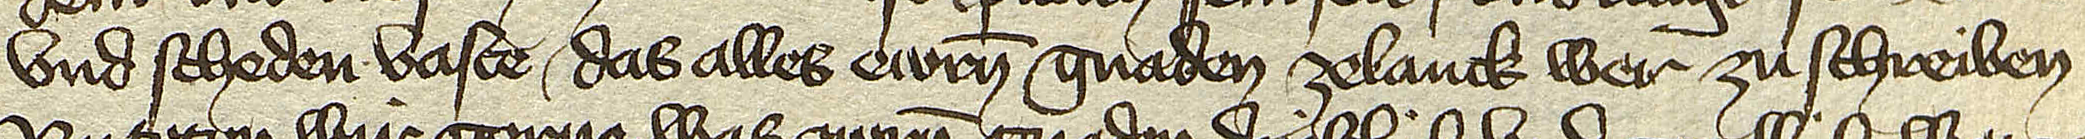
vnd ſcheden vaſte / das alles ewrn* gnaden cʒelanck wer cʒu ſchreiben
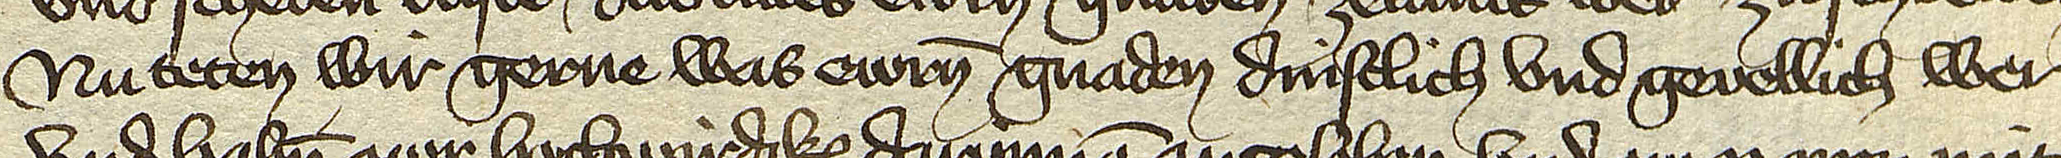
Nu teten wir gerne was ewrn* gnaden dinſtlich vnd gevellich wer
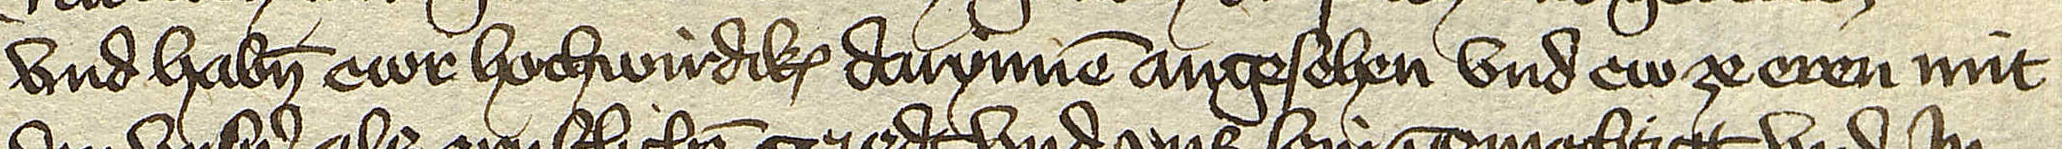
vnd habn* ewr hochwirdik* darynne* angeſehen vnd ew cʒe eren mit
